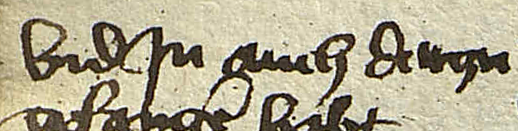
vnd In auch darcʒu
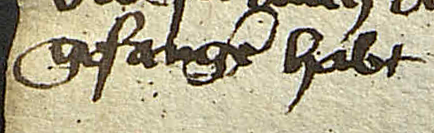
gefange* habt
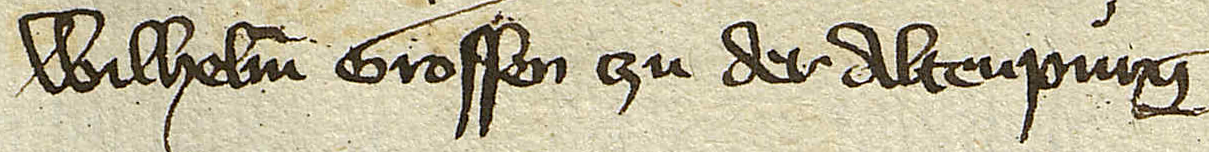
Wilhelm Groſſen cʒu der Altenpürg
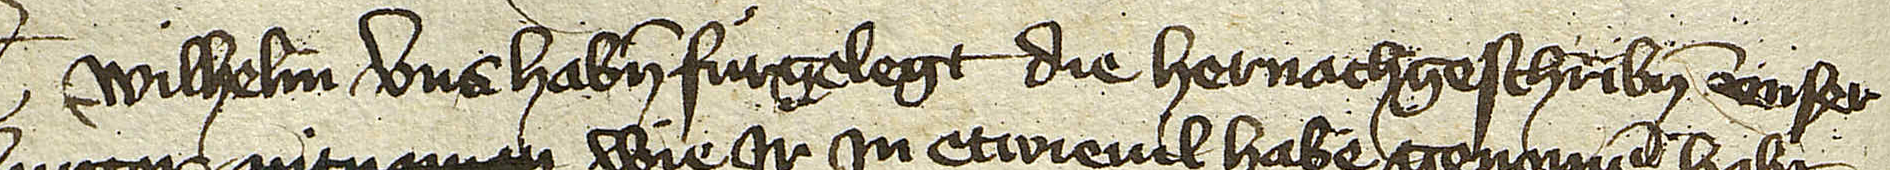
L* wilhelm / vns habn* fürgelegt die hernachgeſchribn* vnſ*er
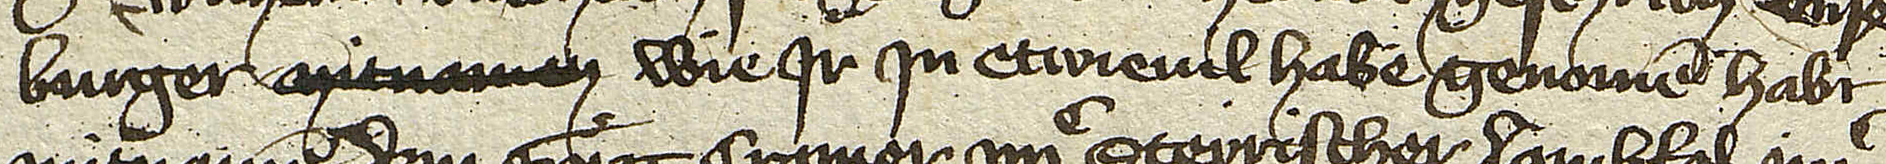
burger mitnamen wie Ir In etwieuil habe genome* habt
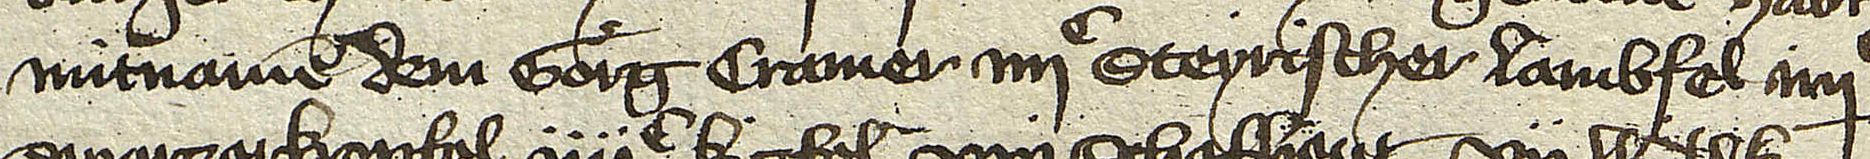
mitname* dem Görg Cramer iiii* Steyriſcher lambfel iiii*
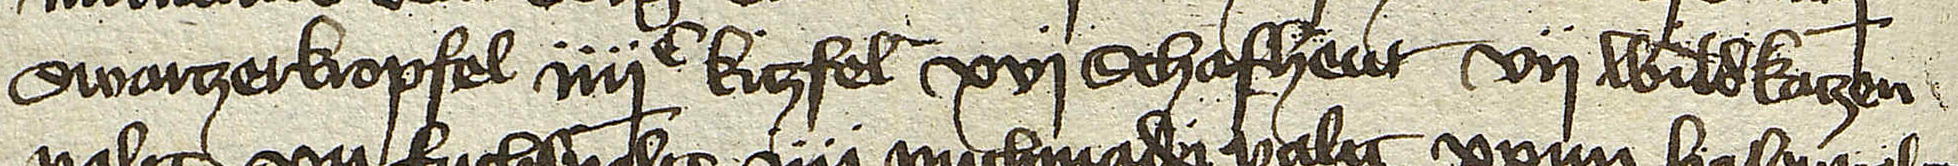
Swarcʒerkropfel iiii* kicʒfel xvi Schafheut vii wildkacʒen
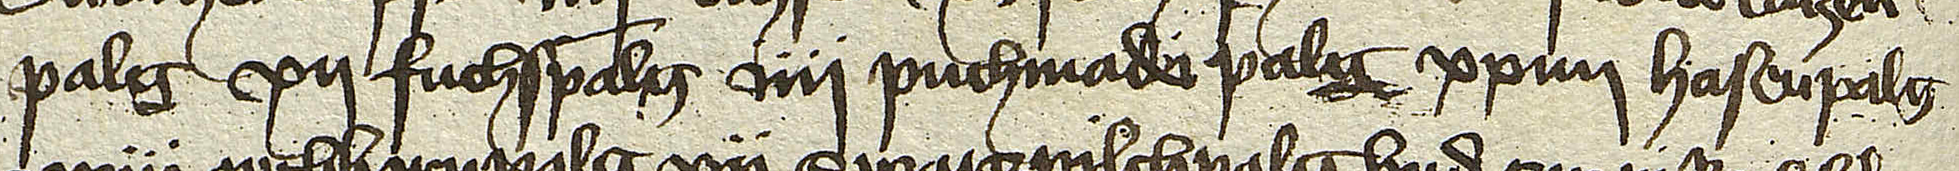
palg xii fuchſpalg iiii puchmader palg xxiiii haſenpalg
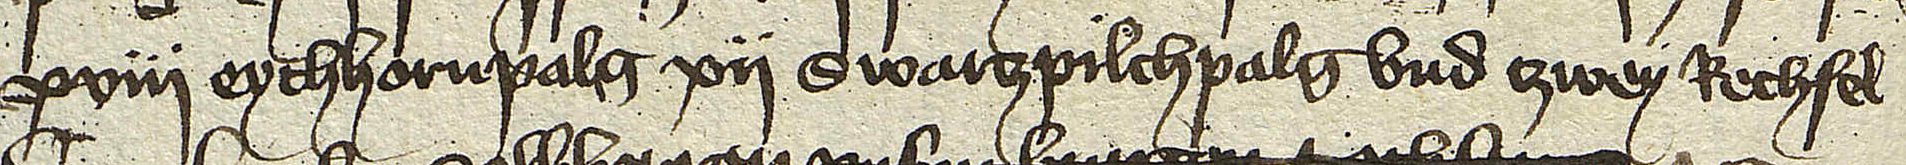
xviii eychhornpalg xii Swarcʒpilchpalg vnd cʒwey Rechfel
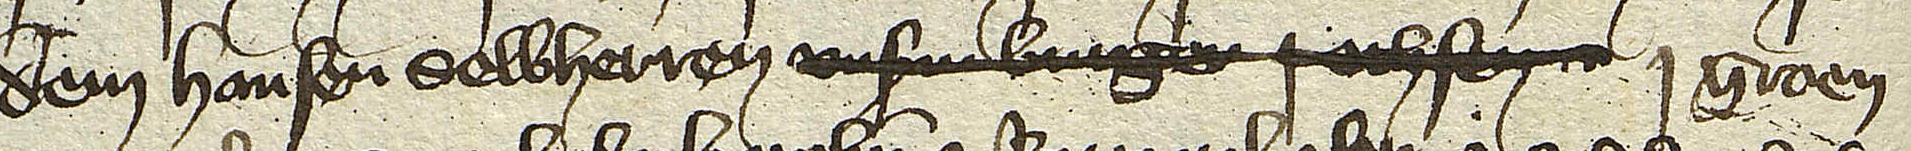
dem hanſen Selbherren vnſ*m burger i ochſen i groen
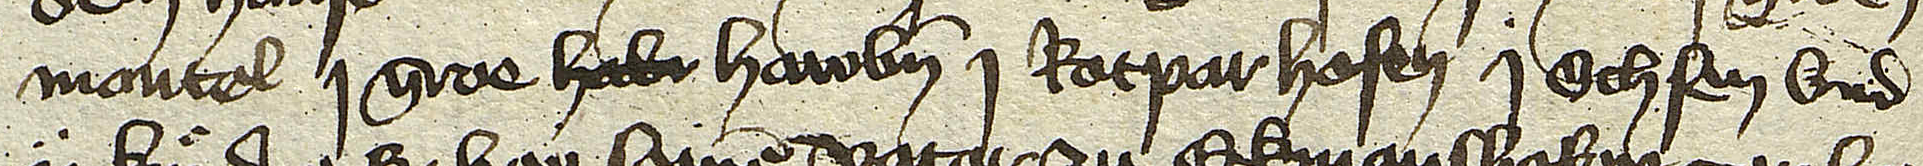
mantel i groe habr hawbn* i Rotparhoſen i Ochſen vnd
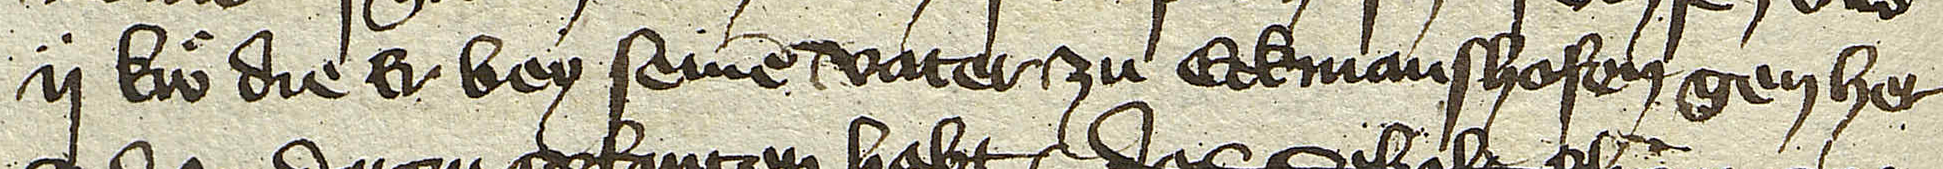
ii kw die Er bey ſeine* vater cʒu Eckmanſhofen gen het
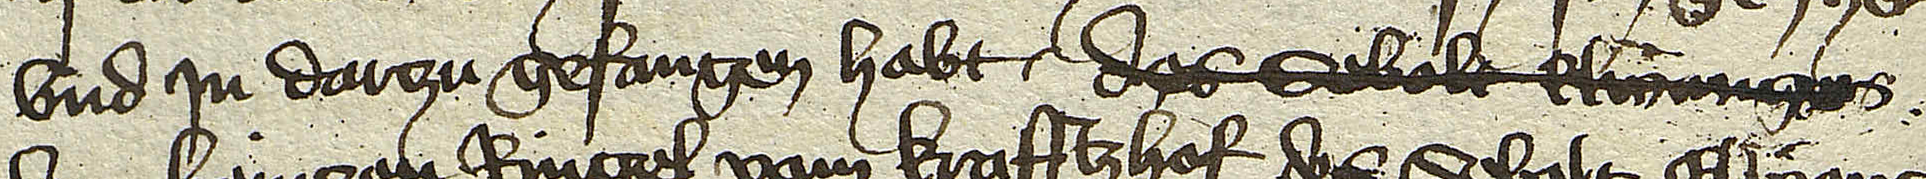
vnd In darcʒu gefangen habt / des Sebolt Elwangers
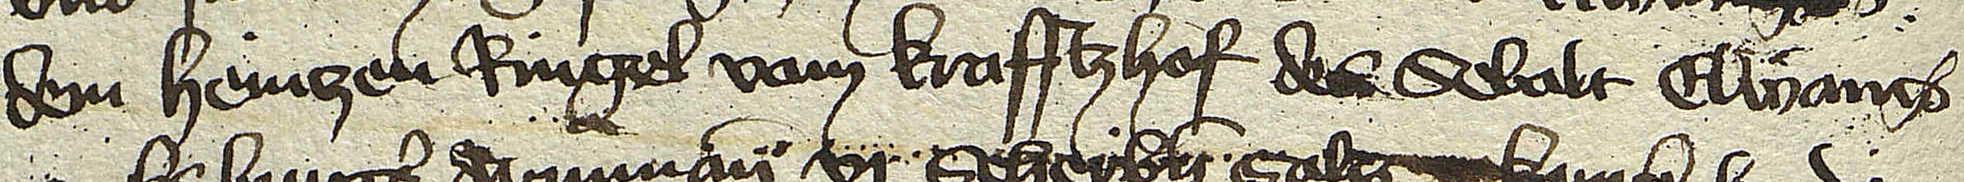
dem heincʒen Ringel vom kraffcʒhof des Sebalt Elwang*s
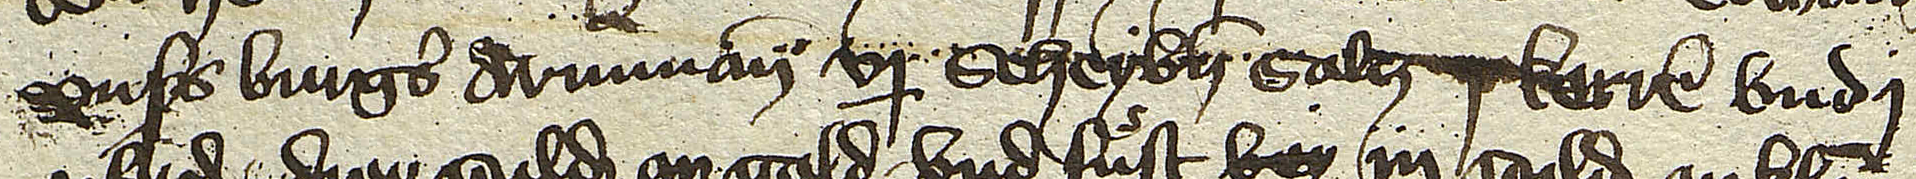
vnſ*s burgs* Armman* vi* Scheybn* Salcʒ i karre* vnd i
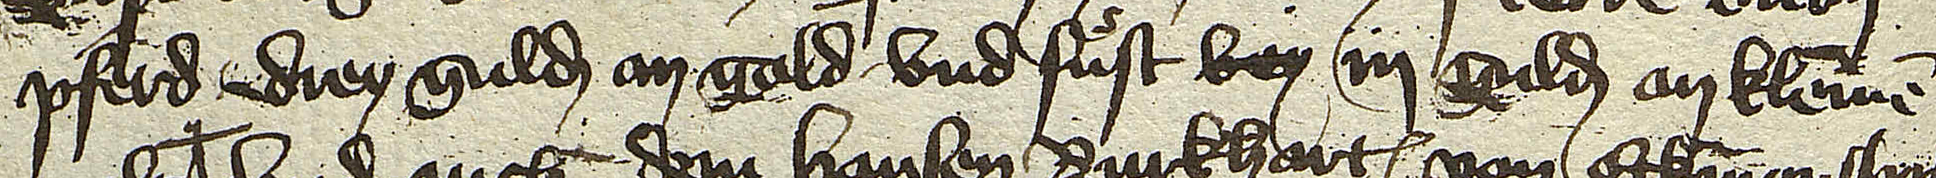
pferd drey guld* an gold vnd ſüſt bey iii guld* an kleine*
